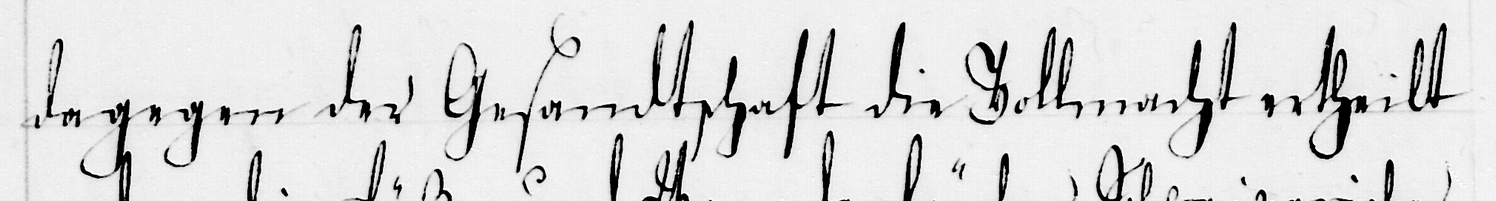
dagegen der Gesandtschaft die Vollmacht ertheilt
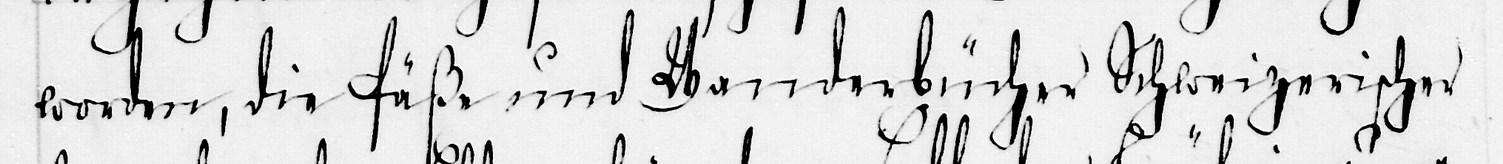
worden, die Päße und Wanderbücher Schweizerischer
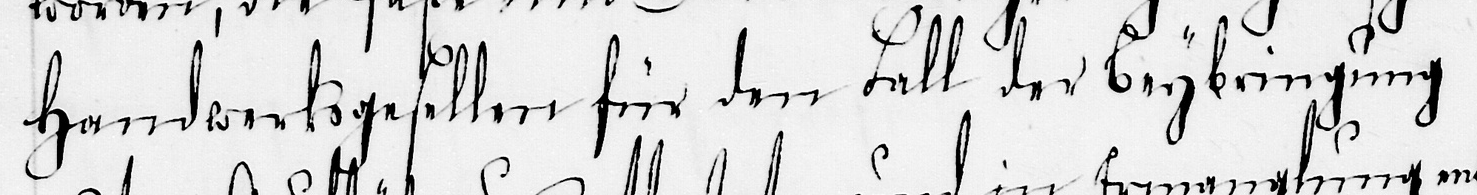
Handwerksgesellen für den Fall der Beybringung
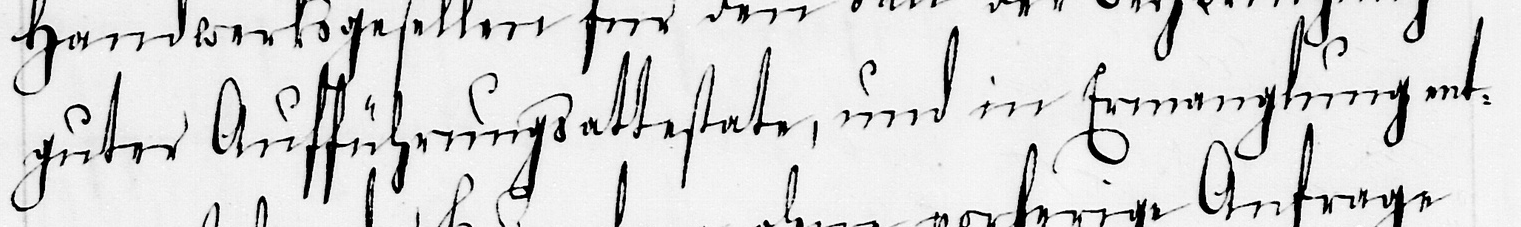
guter Aufführungsattestate, und in Ermanglung ent¬
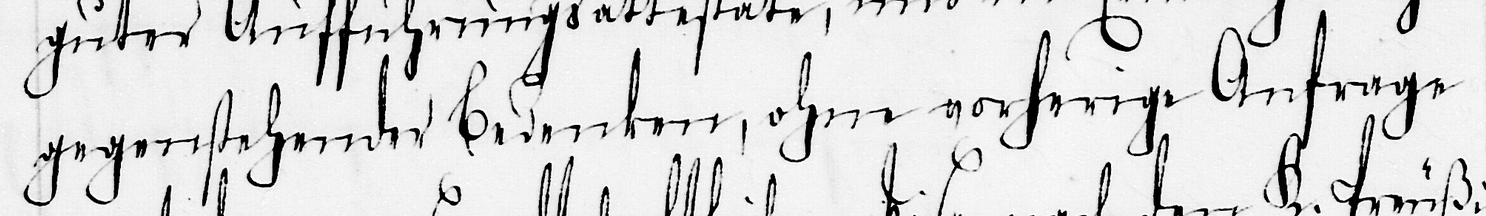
gegenstehender Bedenken, ohne vorherige Anfrage
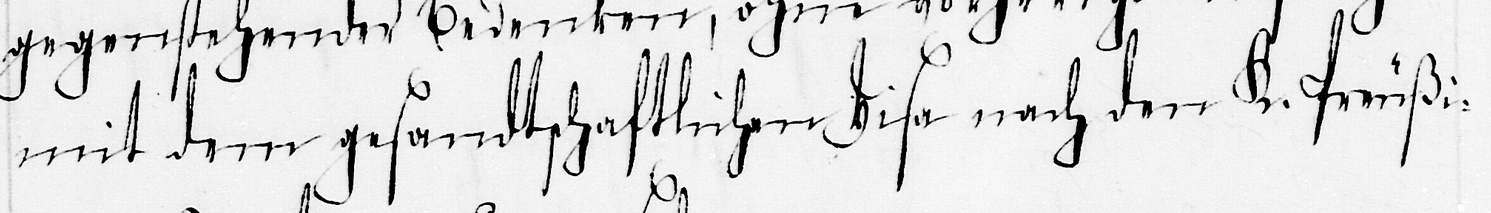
mit dem gesandtschaftlichen Visa nach den K. Preußi¬
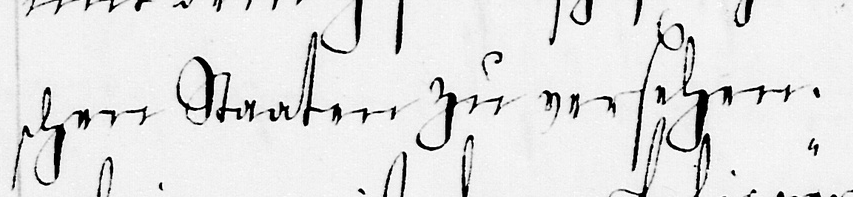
schen Staaten zu versehen.
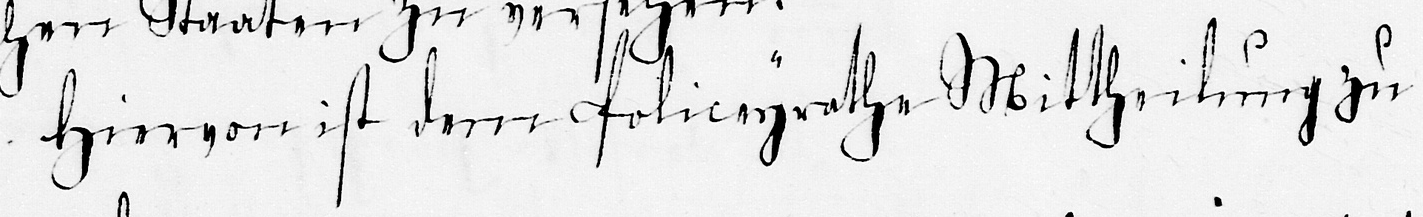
Hiervon ist dem Policeyrathe Mittheilung zu
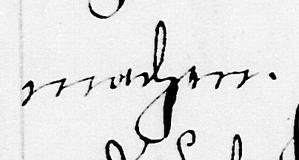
machen.
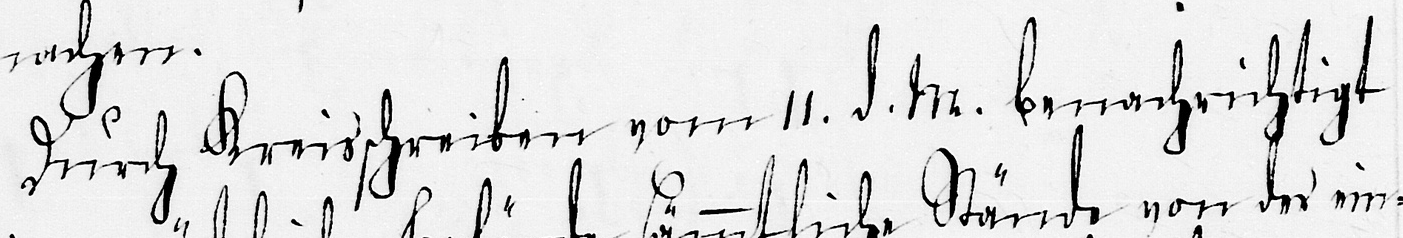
Durch Kreisschreiben vom 11. d. M. benachrichtigt
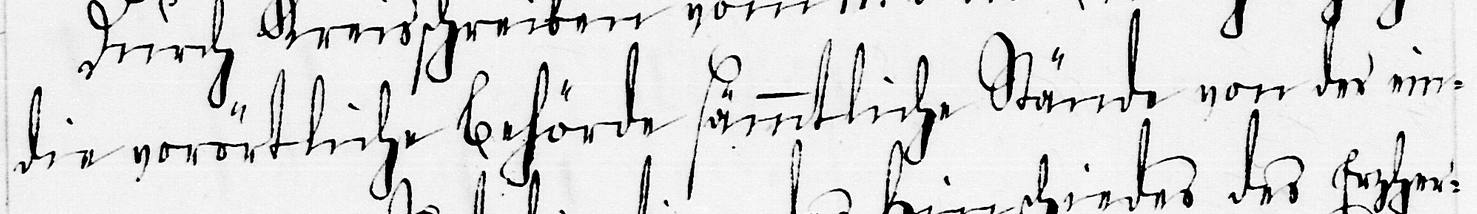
die vorörtliche Behörde sämmtliche Stände von der ei¬
